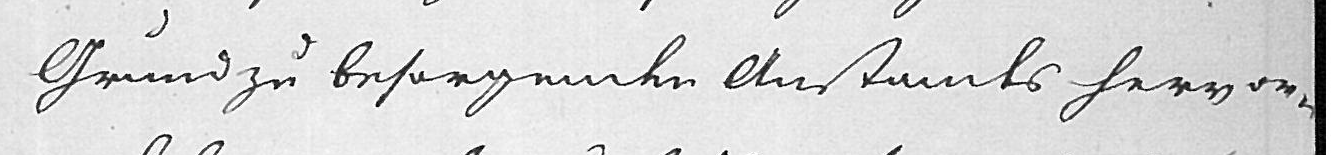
Grund zu besorgenden Anstands hervor-
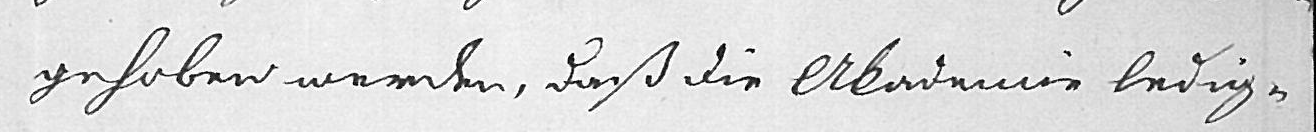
gehoben werden, daß die Akademie ledig-
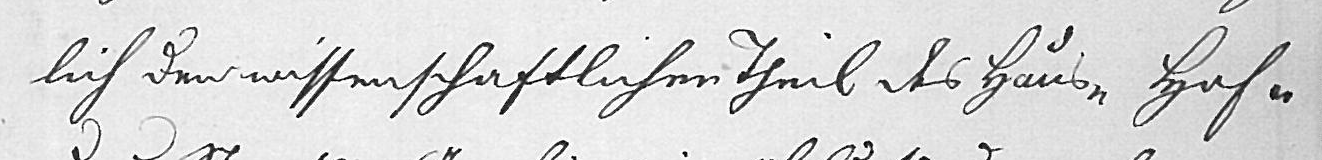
lich der wissenschaftlichen Theil des Haus- Hof-
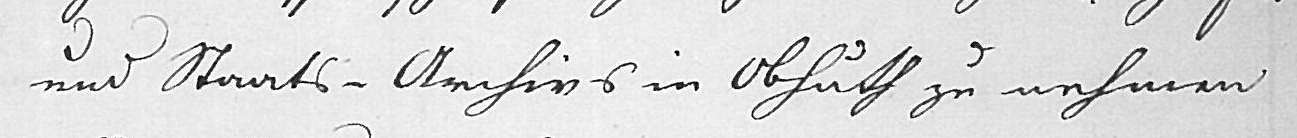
und Staats-Archivs in Obhuth zu nehmen
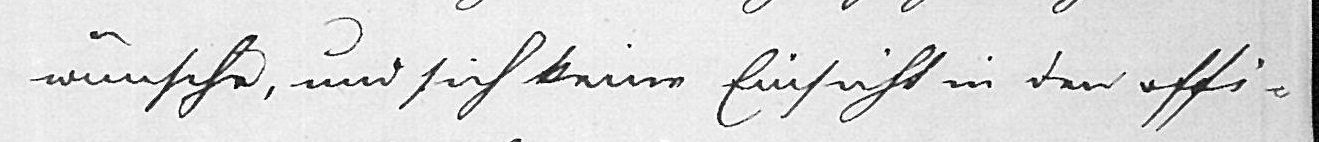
wünsche, und sich keine Einsicht in den offi-
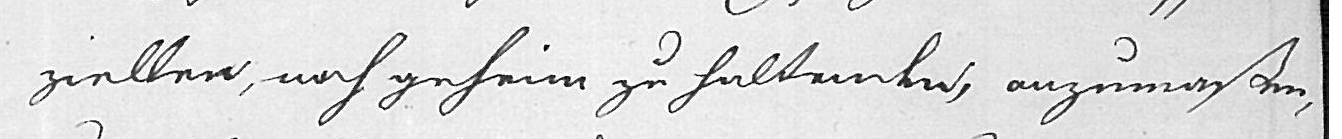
ziellen, noch geheim zu haltenden, anzumaßen,
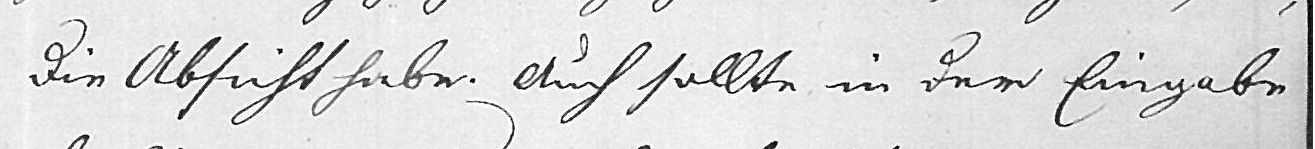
die Absicht habe. Auch sollte in der Eingabe
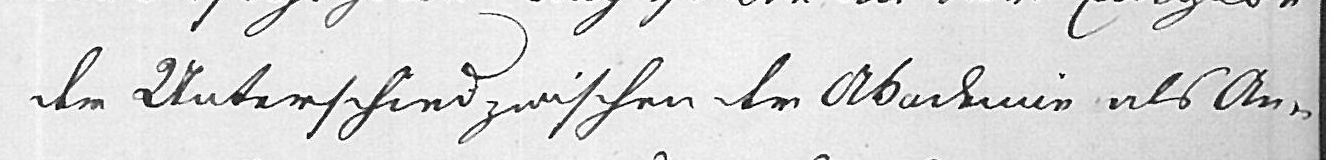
der Unterschied zwischen der Akademie als An-
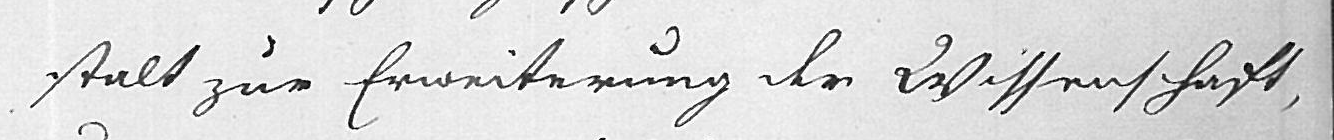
stalt zur Erweiterung der Wissenschaft,
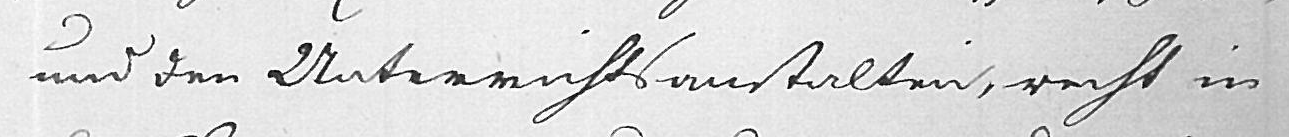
und den Unterrichtsanstalten, recht in
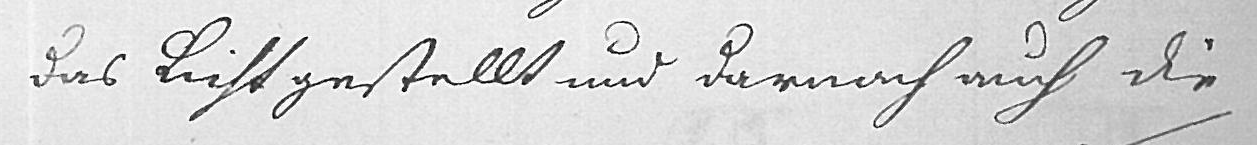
das Licht gestellt und darnach auch die
